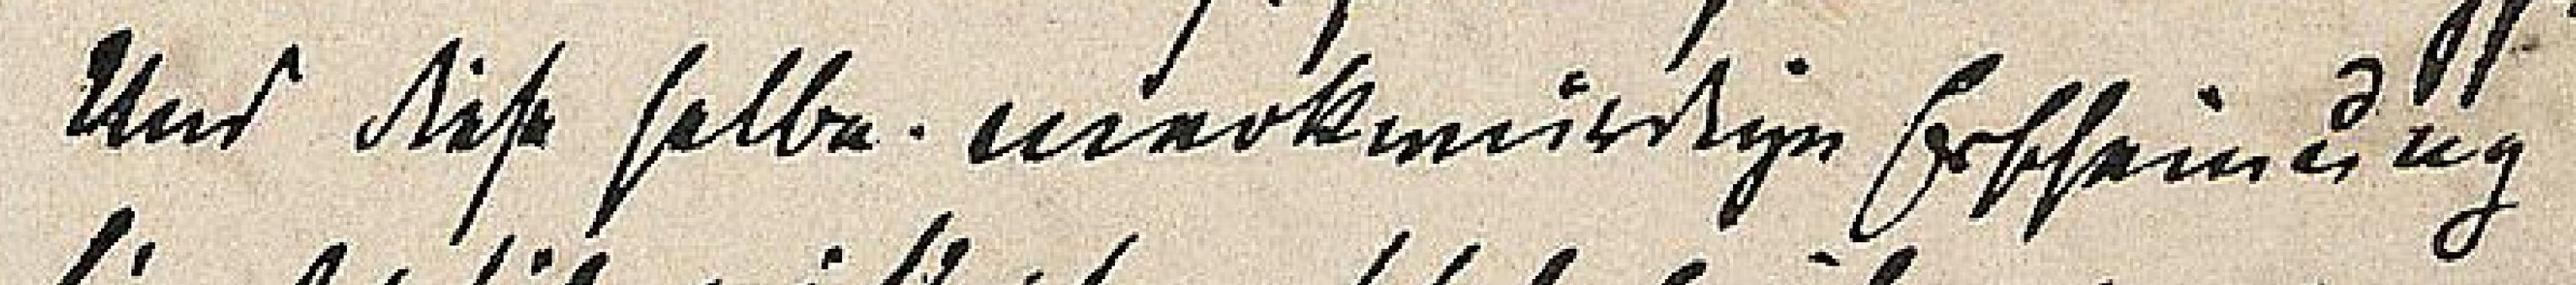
Und diese selbe merkwürdige Erscheinung
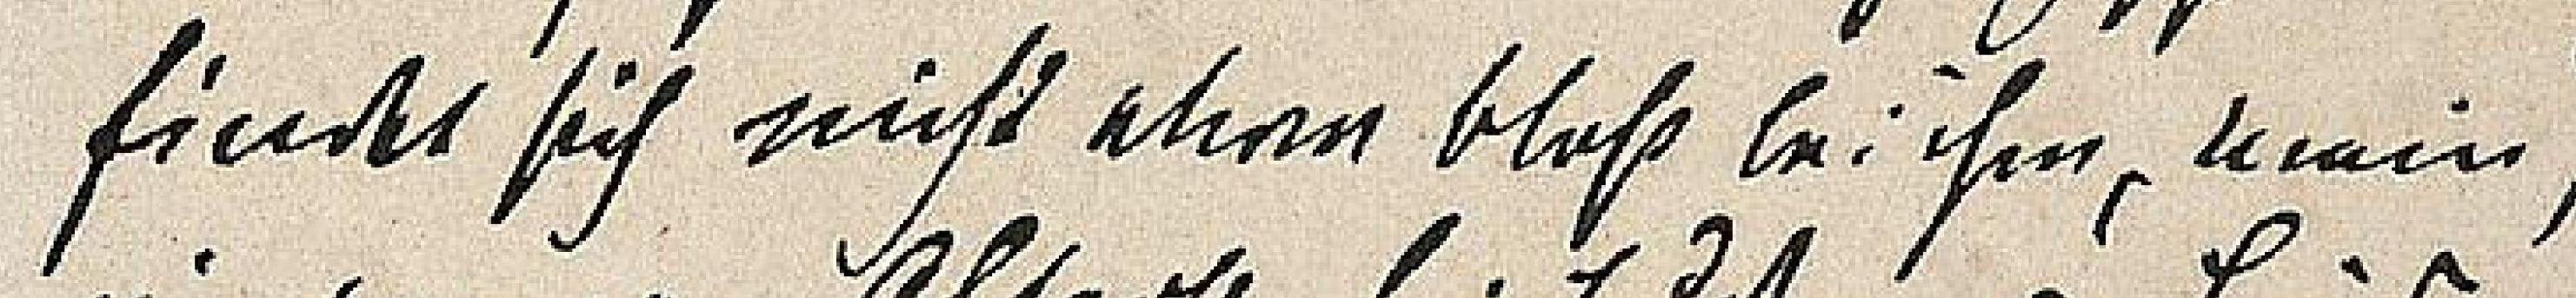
findet sich nicht etwa bloß bei ihm, nein,
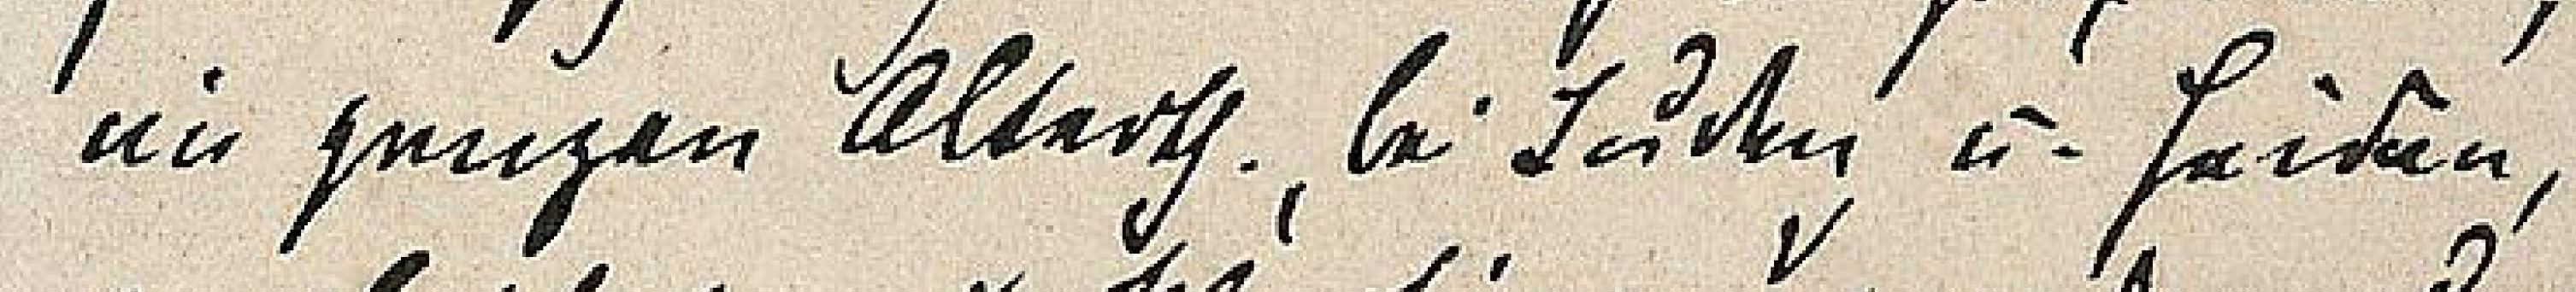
im ganzen Alterth., bei Juden u. Heiden,
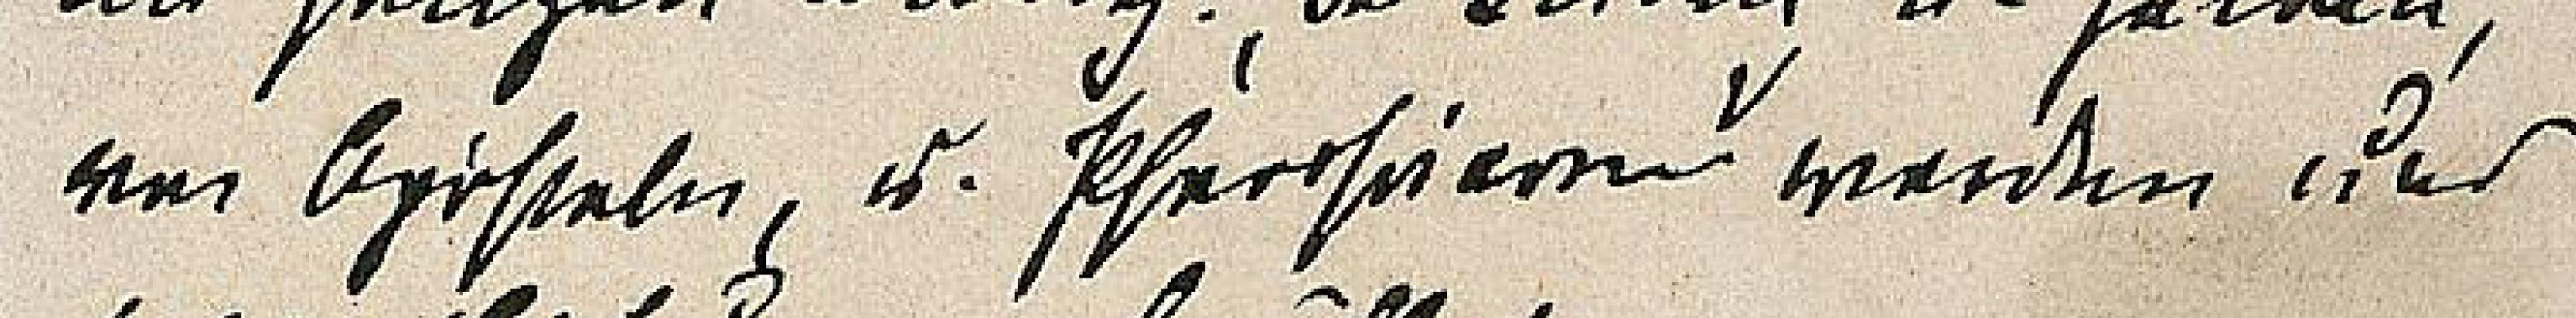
von Aposteln, u. Pharisäern werden uns
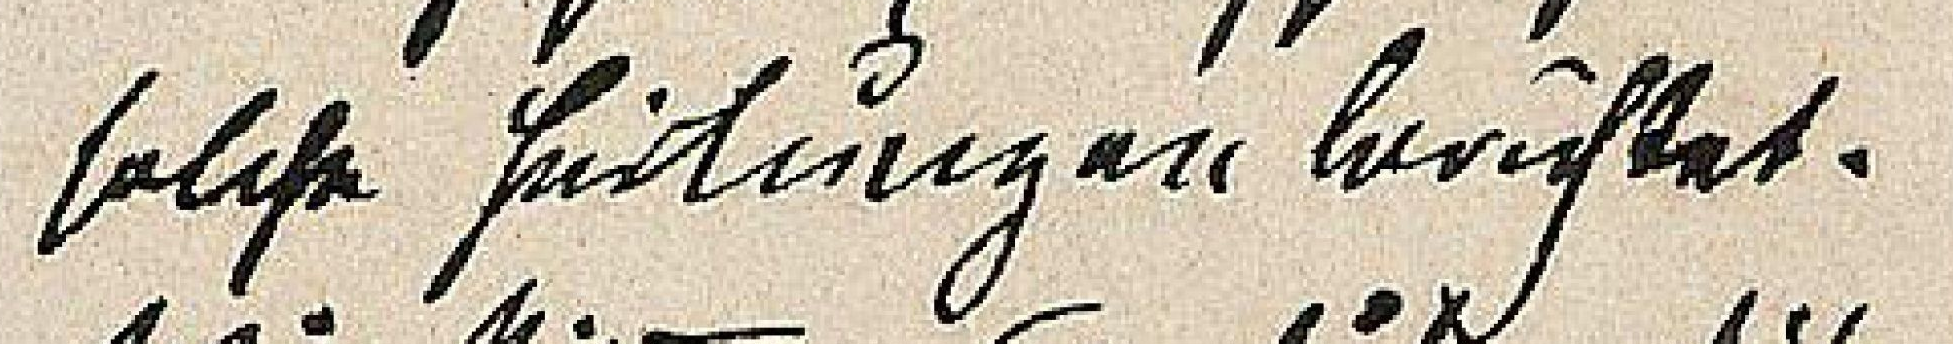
solche Heilungen berichtet.
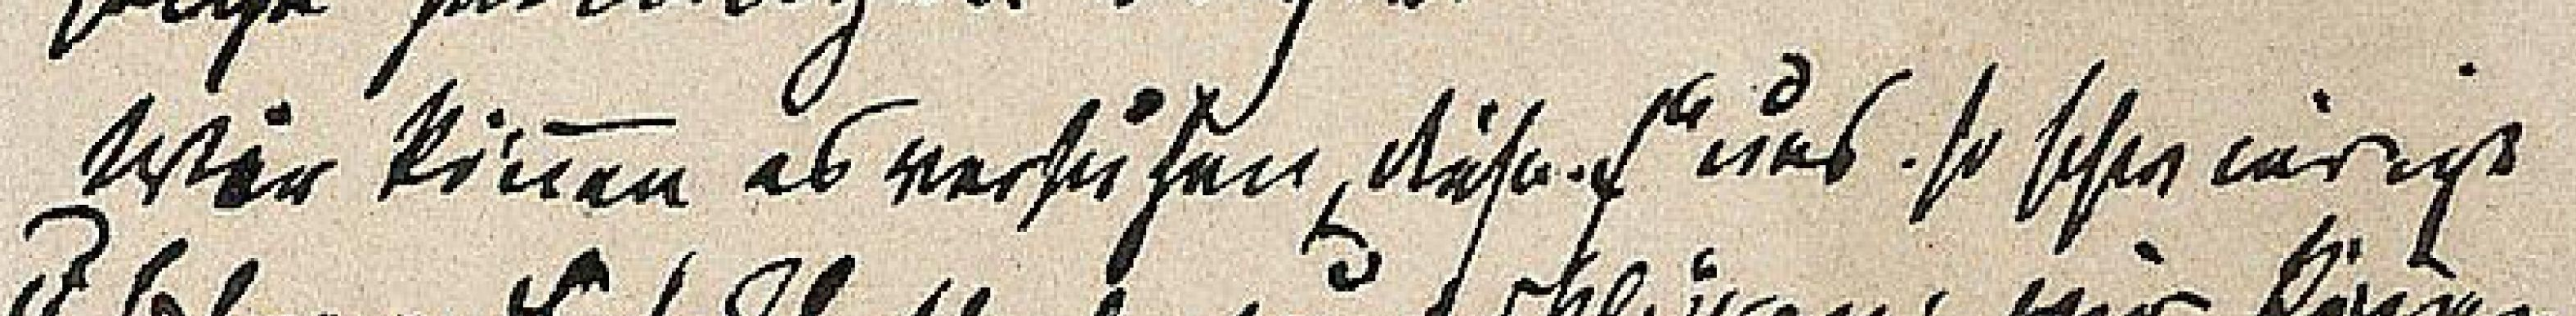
Wir können es versuchen, diese fü uns so schwierige
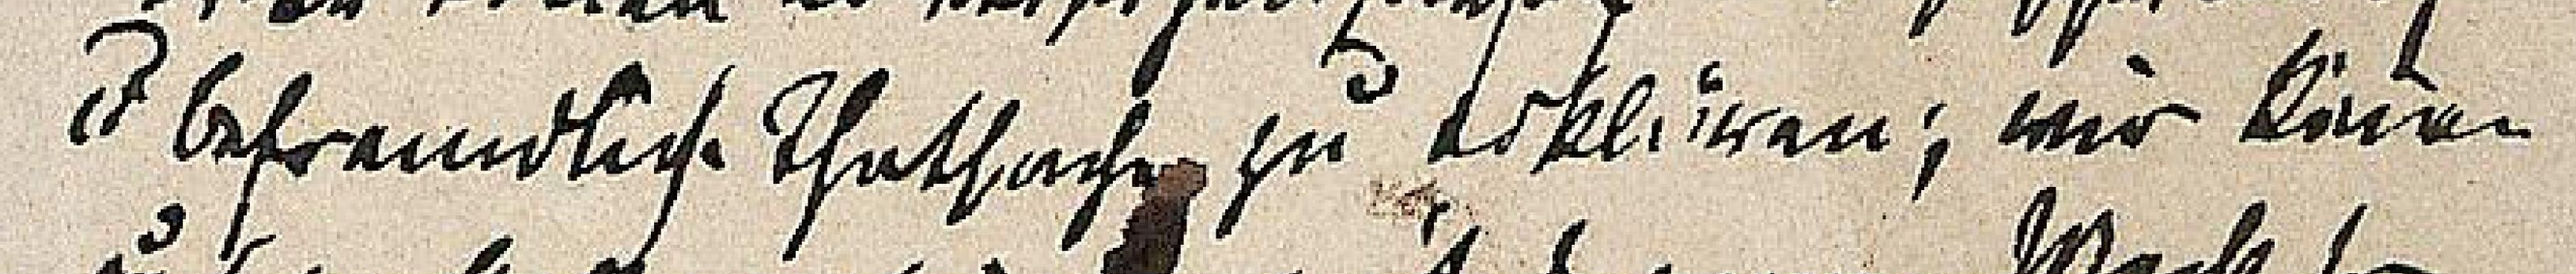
u befrendliche Thatsache zu erklären; wir könen
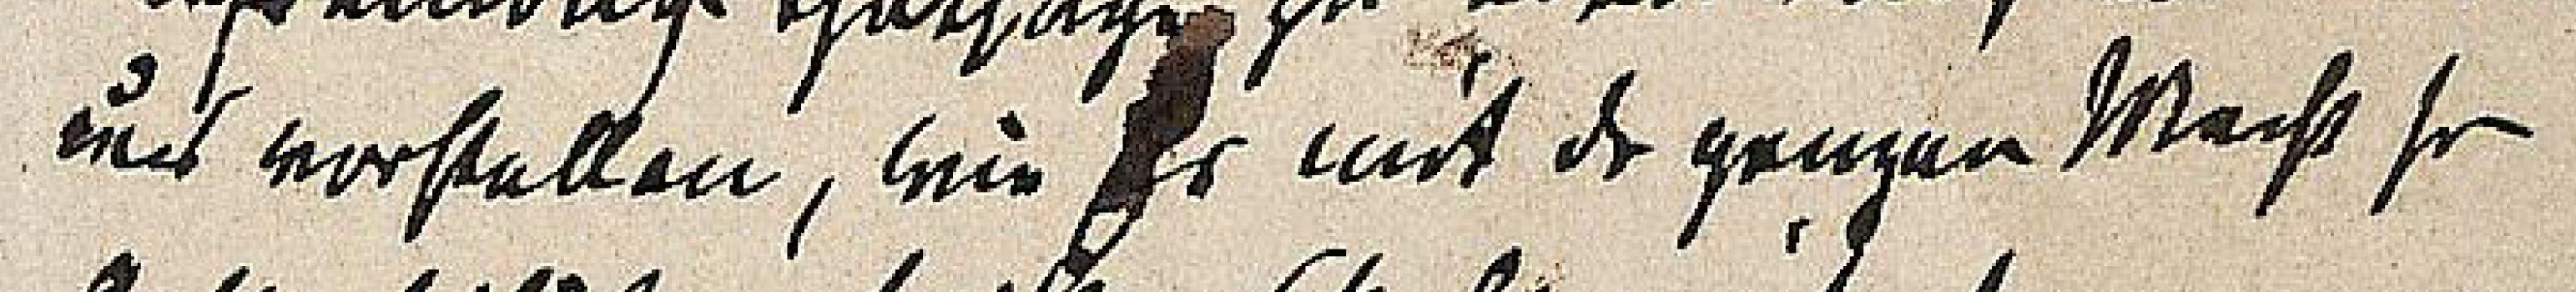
uns vorstellen, wie Er mit der ganzen Macht sr
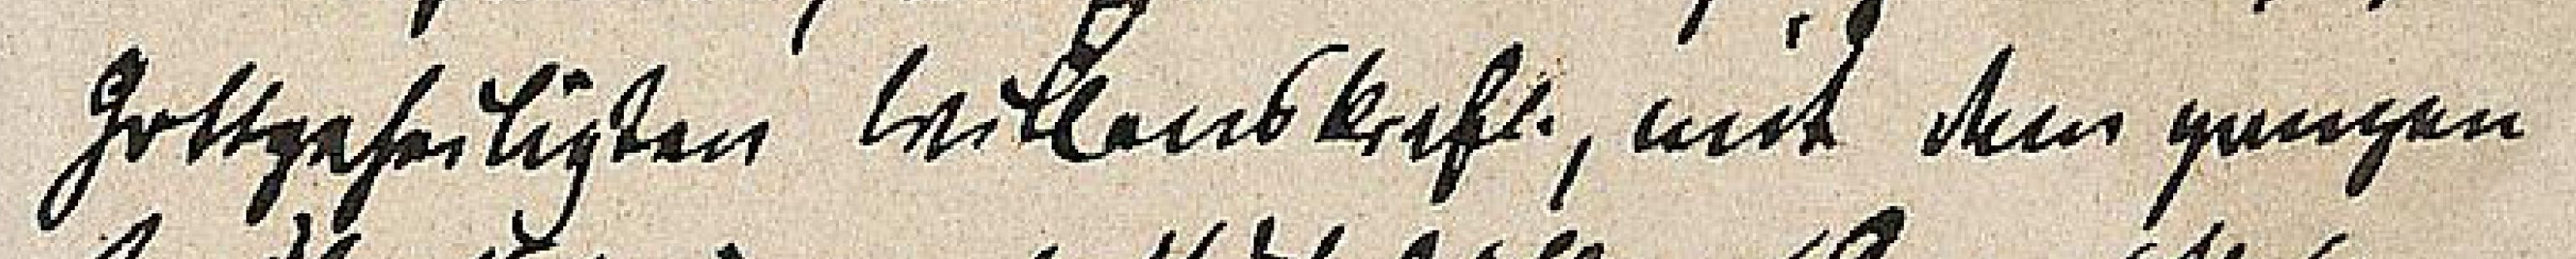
Gottgeheiligten Willenskraft, mit dem ganzen
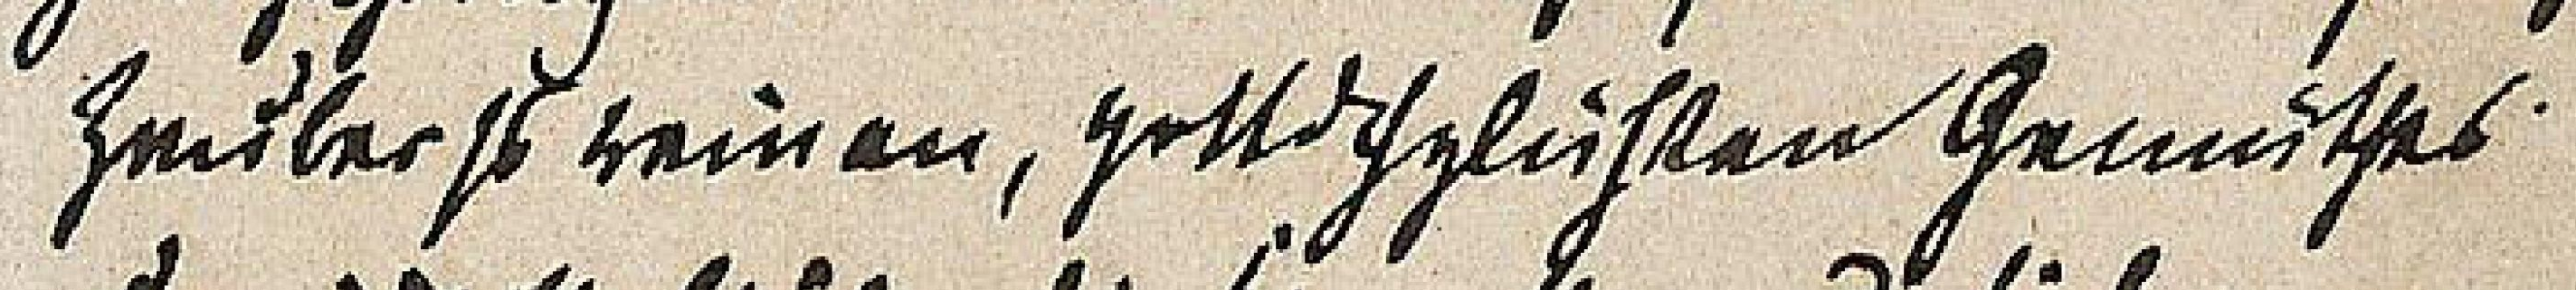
Zauber ss reinen, gottdchglühten Gemüthes
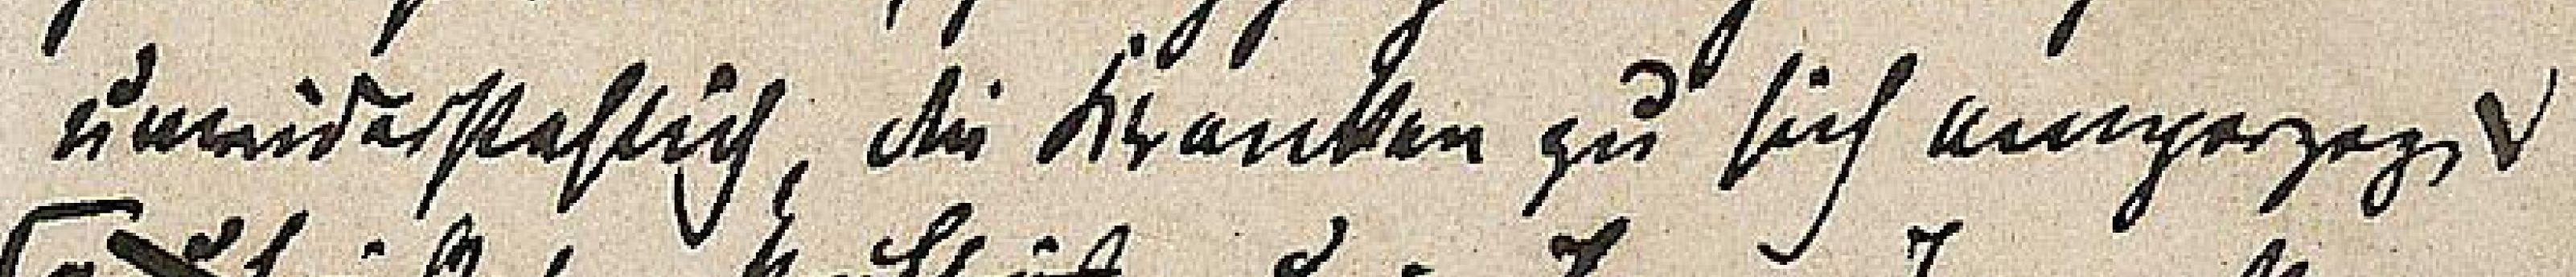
unwiderstehlich, die Kranken zu sich emporgezog V
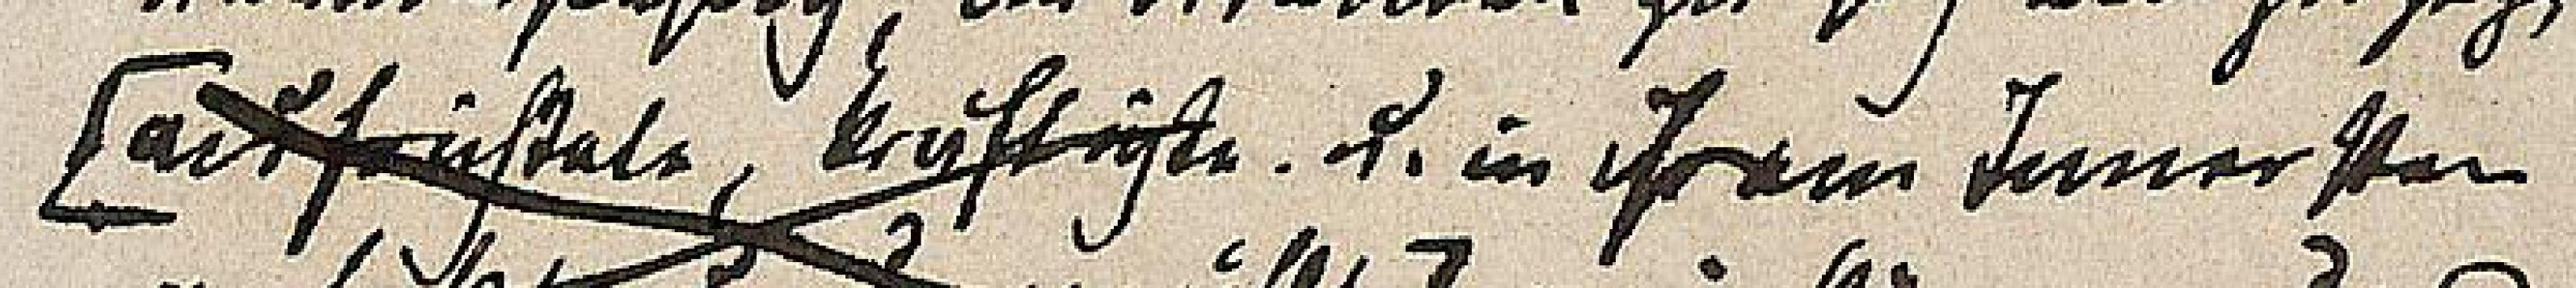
aufrichtete, kräftigte. u. in ihrem Innersten
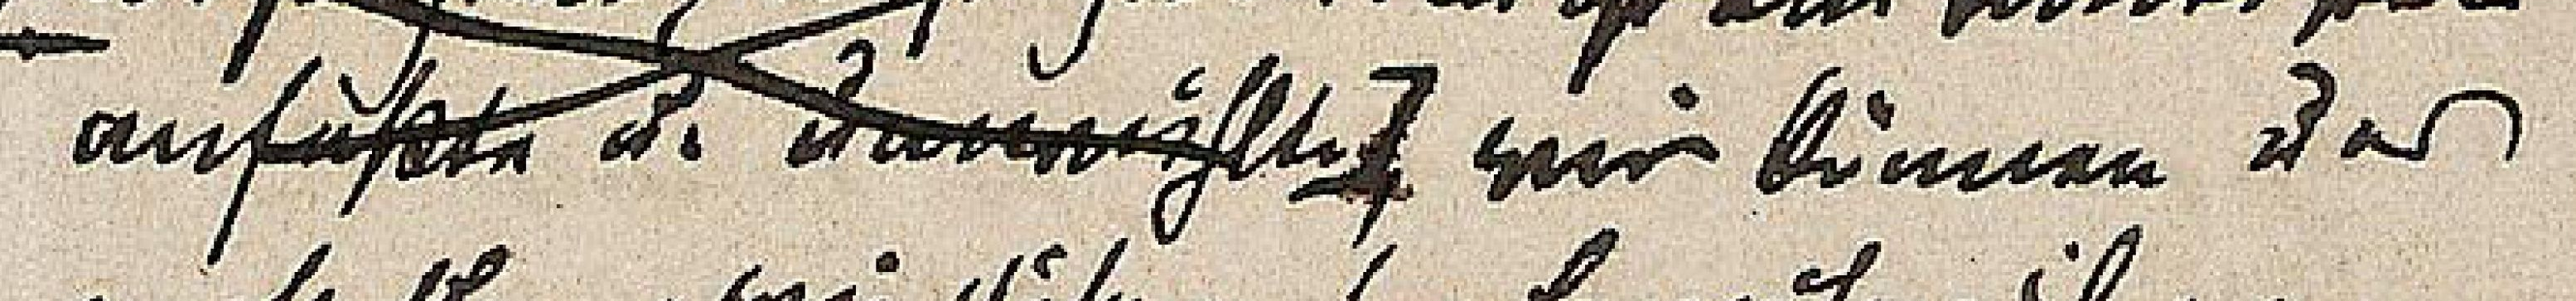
anfaßte u. umwühlte wir können uns
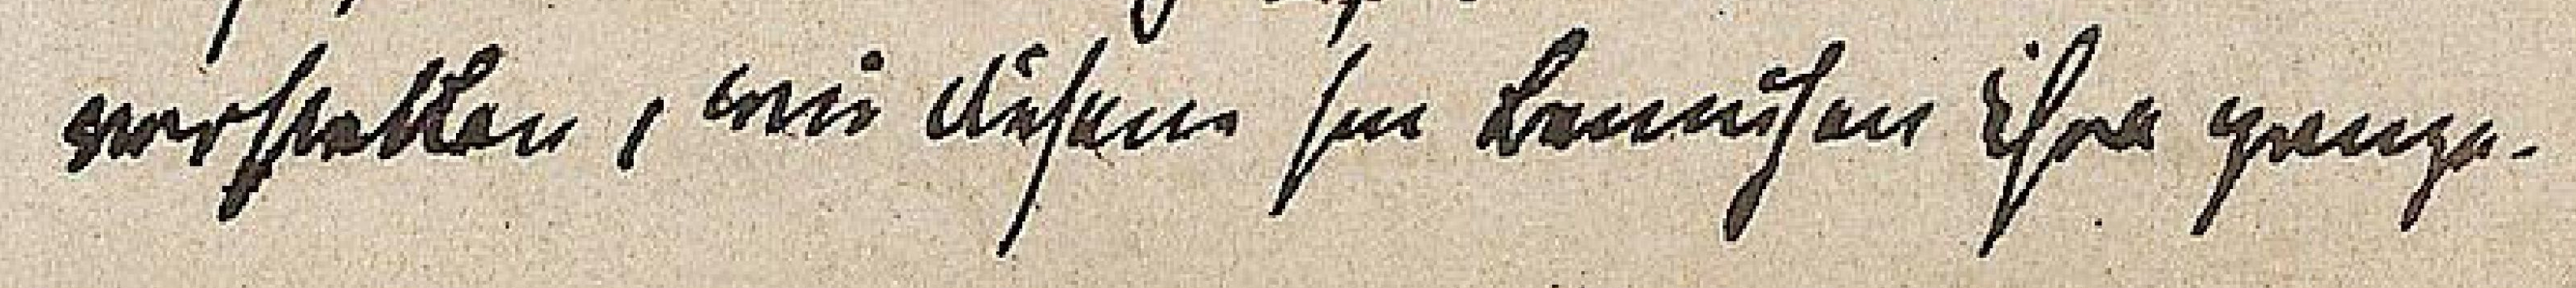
vorstellen, wie diesen sm Bemühen ihn ganze.
